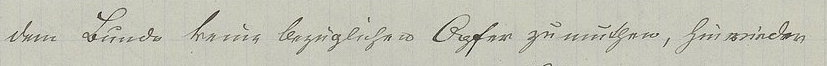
dem Bunde keine bezüglichen Opfer zumuthen, hinwieder
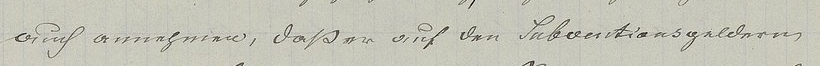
auch annehmen, daß er auf den Subventionsgeldern
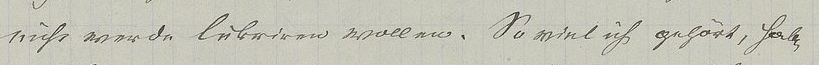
nicht werde lukriren wollen. So viel ich gehört, habe
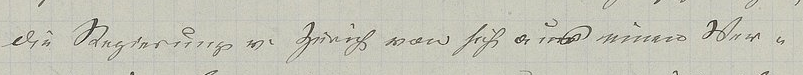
die Regierung v. Zürich von sich aus einen Ver-
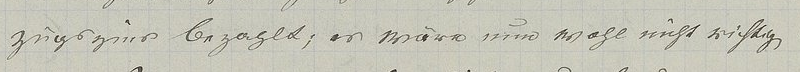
zugszins bezahlt; es wäre nun wohl nicht richtig,
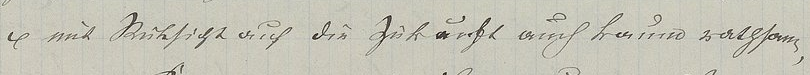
& mit Rüksicht auf die Zukunft auch kaum rathsam,
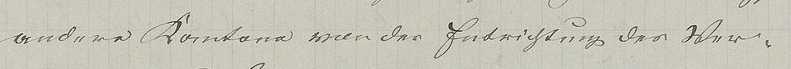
andere Kantone von der Entrichtung des Ver-
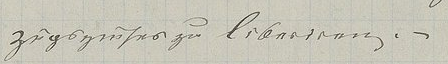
zugszinses zu liberiren. –
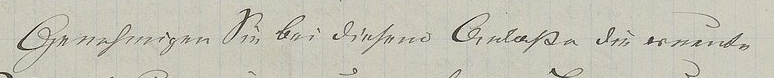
Genehmigen Sie bei diesem Anlaße die erneute
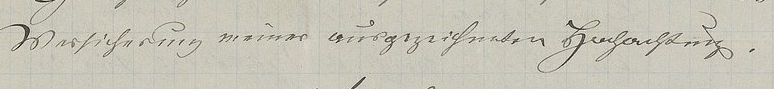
Versicherung meiner ausgezeichneten Hochachtung.
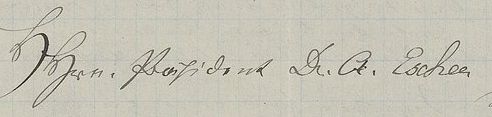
HHrn. Präsident Dr. A. Escher
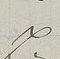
in
